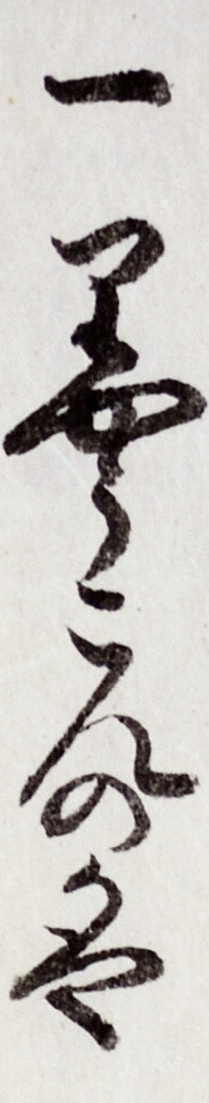一りやうこんのかや
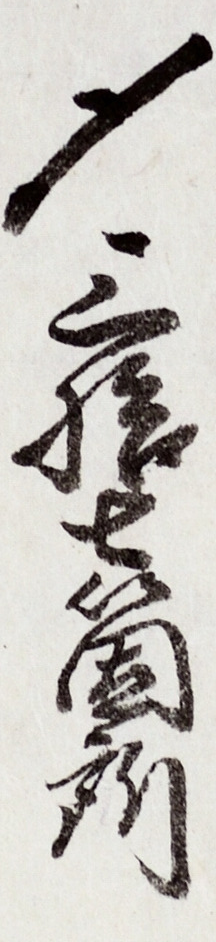〆三拾七箇所
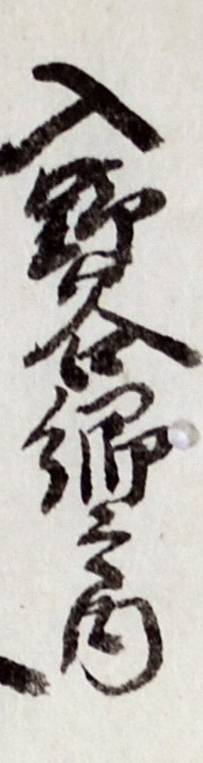入野谷郷之内
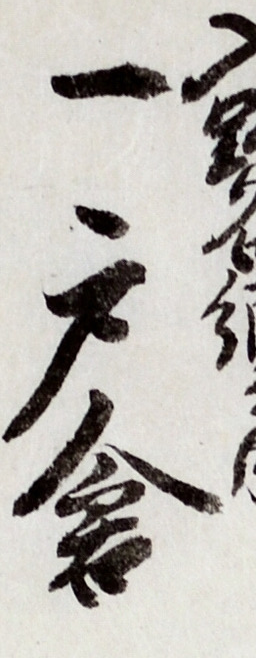一戸倉
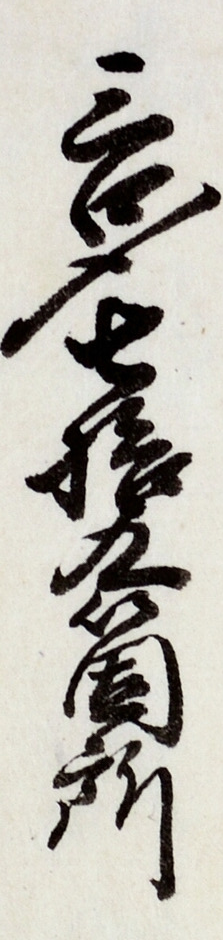三口〆七拾九箇所
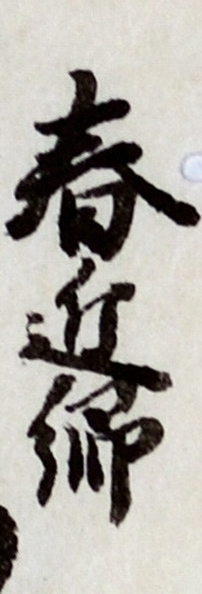春近郷
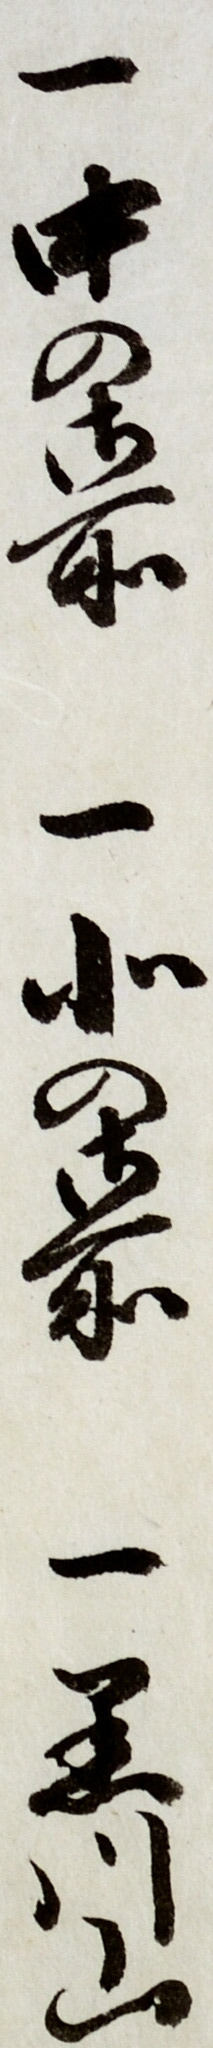一中の御所一北の御所一黒川山
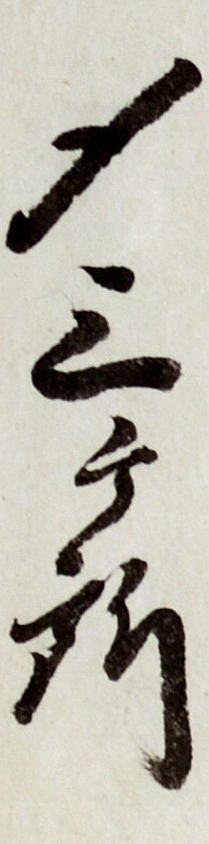〆三ケ所

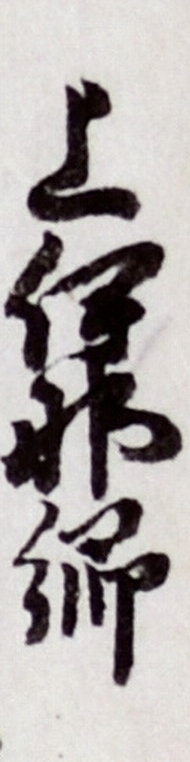上伊那郷
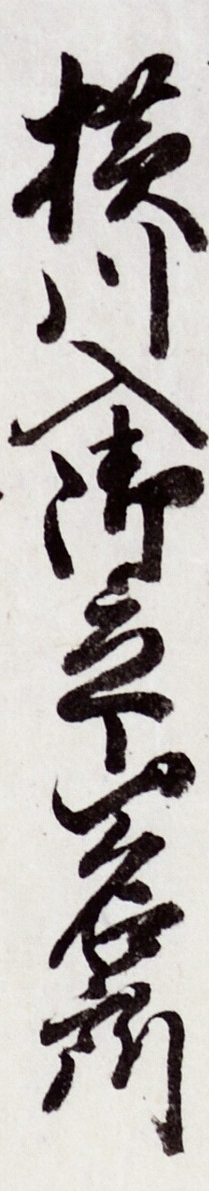横川入御立山名所
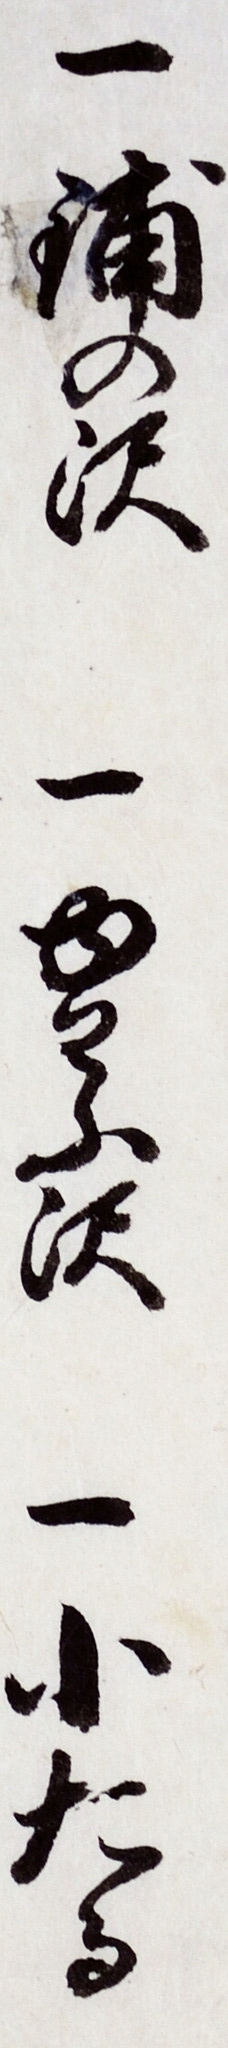一鋪の沢一ゆわふ沢一小たる
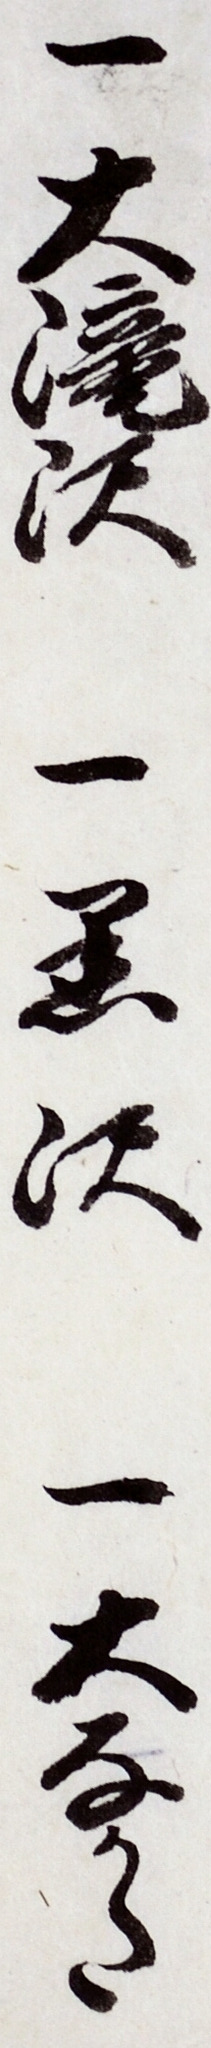一大滝沢一黒沢一大なかた
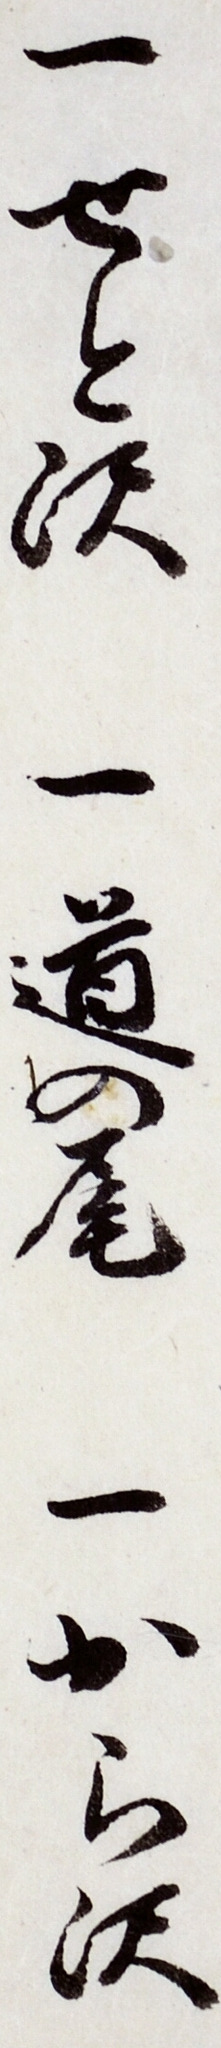一せと沢一道の尾一から沢
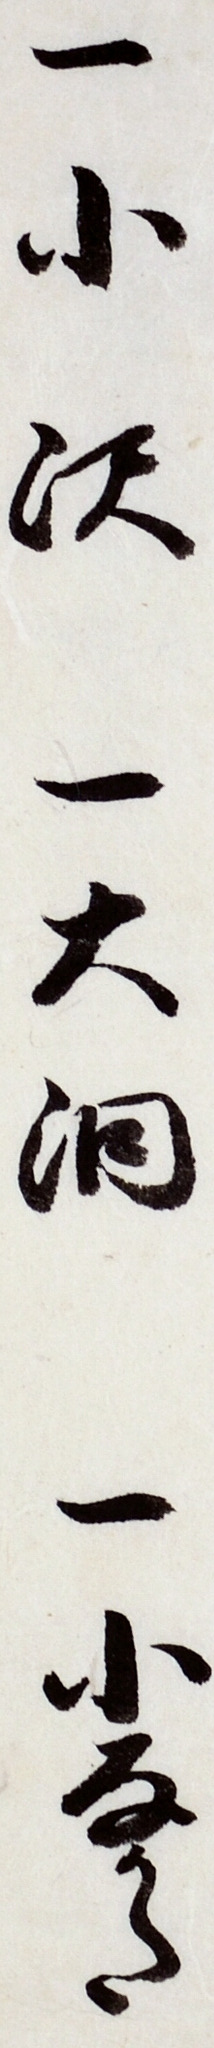一小沢一大洞一小なかた
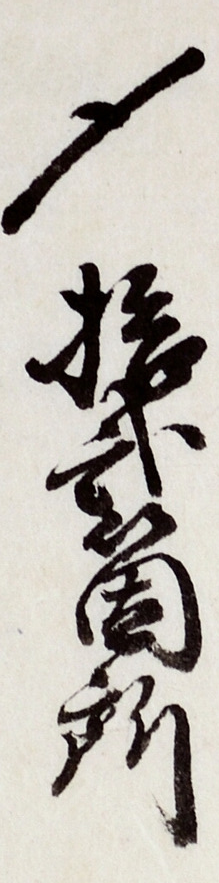〆拾弐箇所
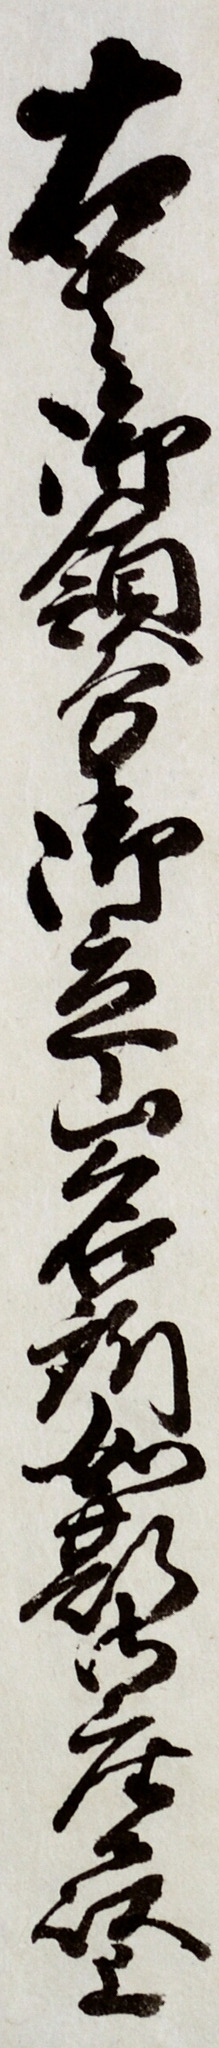右者御領分御立山名所如斯御座候以上
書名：御領分御立山名所帳
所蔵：伊那市立高遠町図書館・合同会社AMANE
